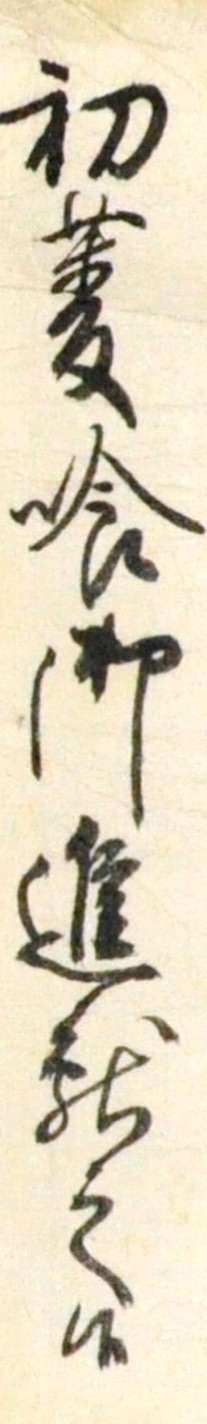初菱喰御進献之候
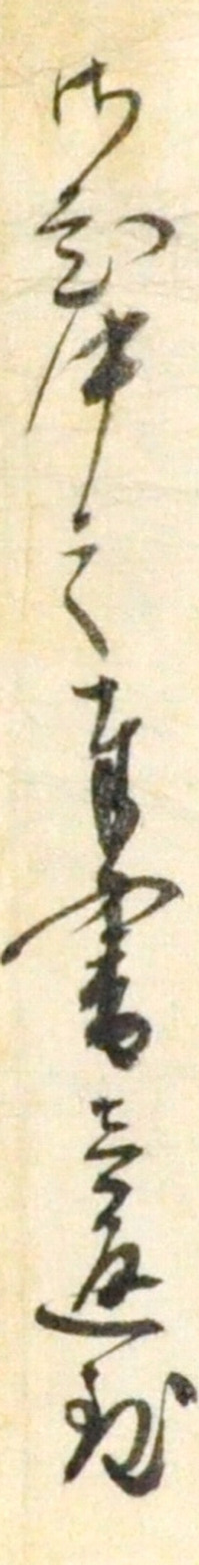御老中之奉書壱通致
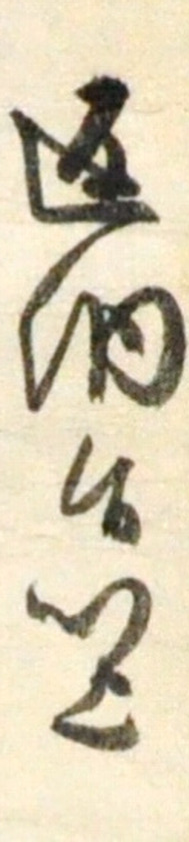返納候以上
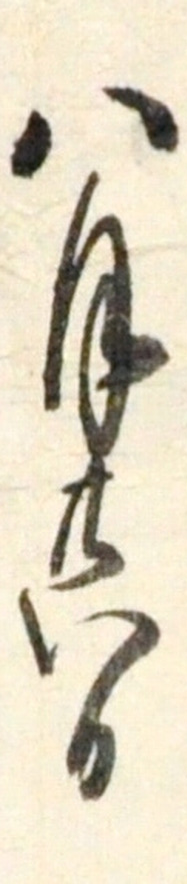八月廿八日
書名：覚
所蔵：伊那市立高遠町図書館・合同会社AMANE
